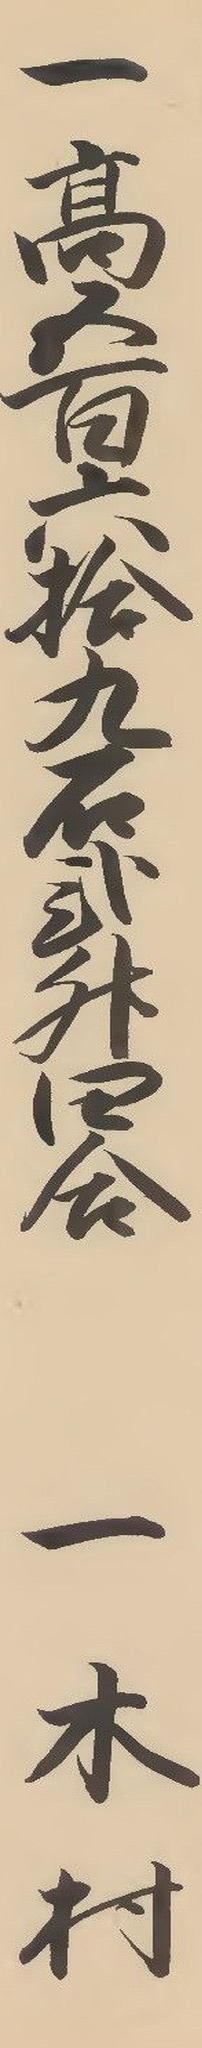一高五百六拾九石弐升四合一木村
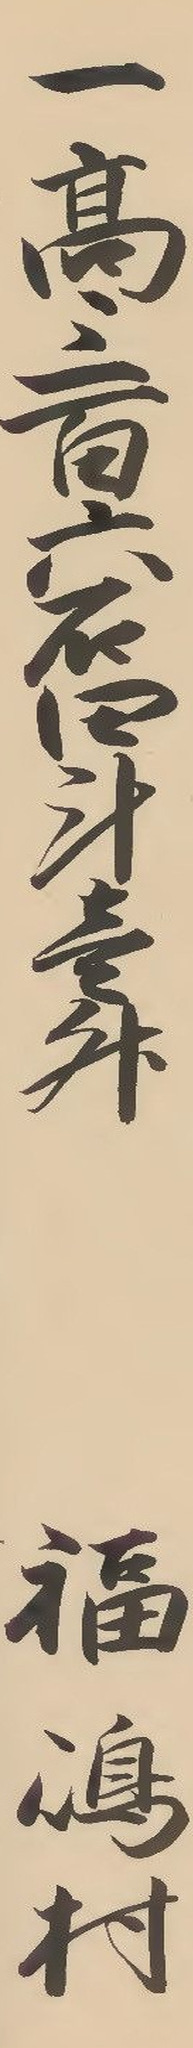一高三百六石四斗壱升福島村
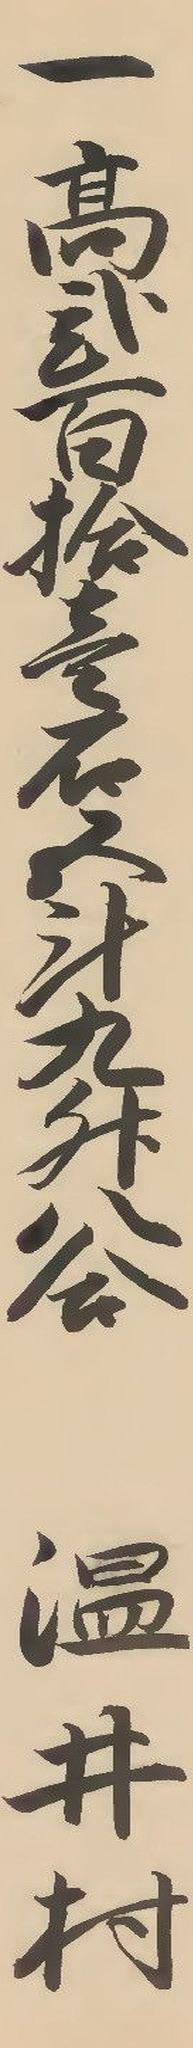一高弐百拾壱石五斗九升八合温井村
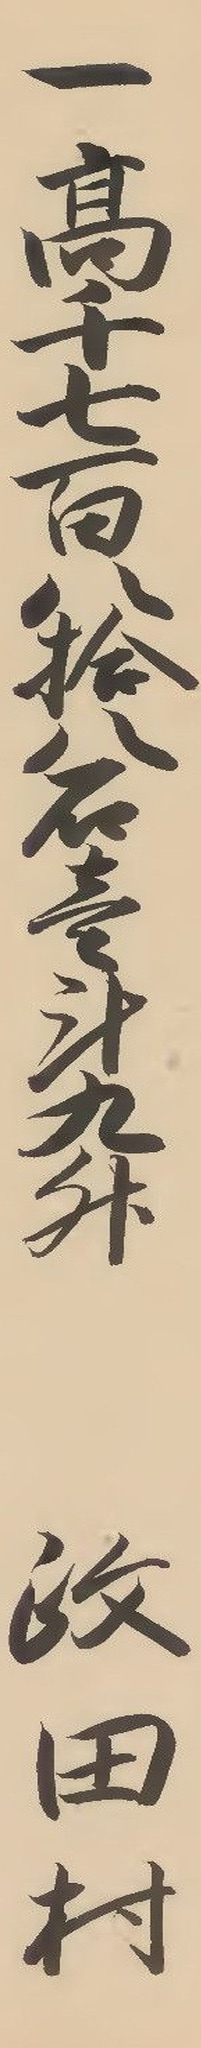一高千七百八拾八石壱斗九升政田村
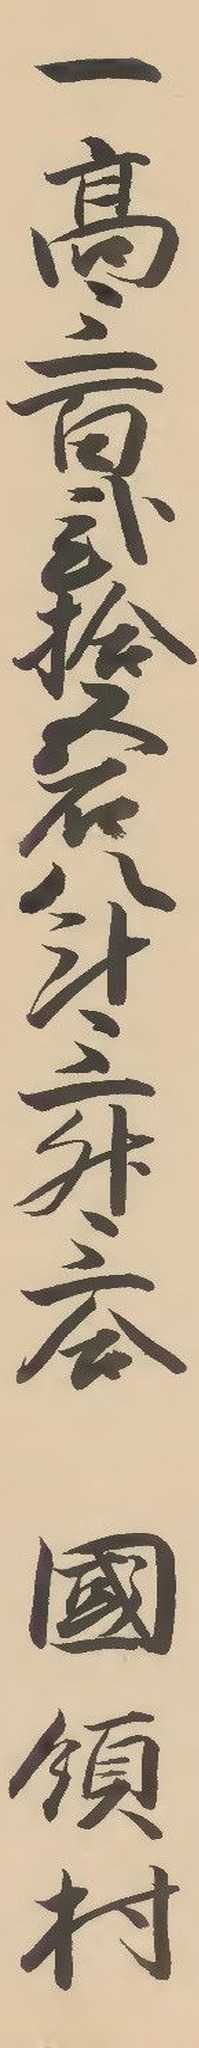一高三百弐拾五石八斗三升三合国領村

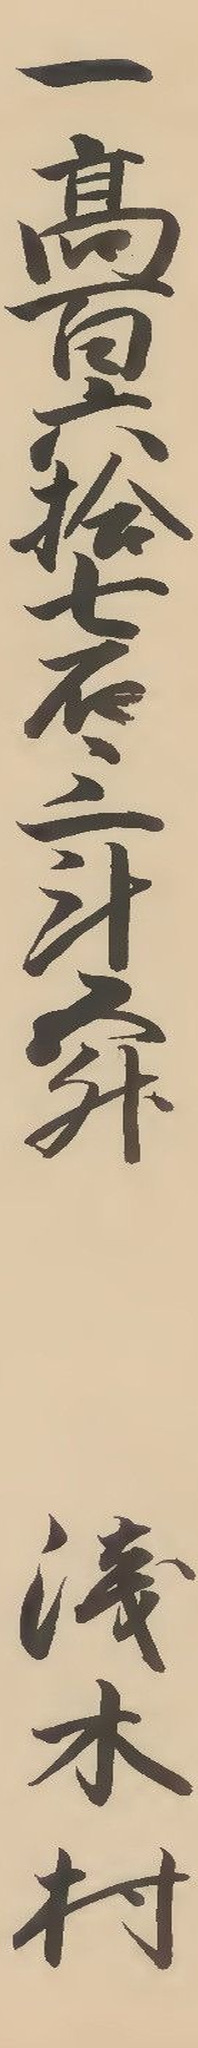一高百六拾七石三斗五升浅木村
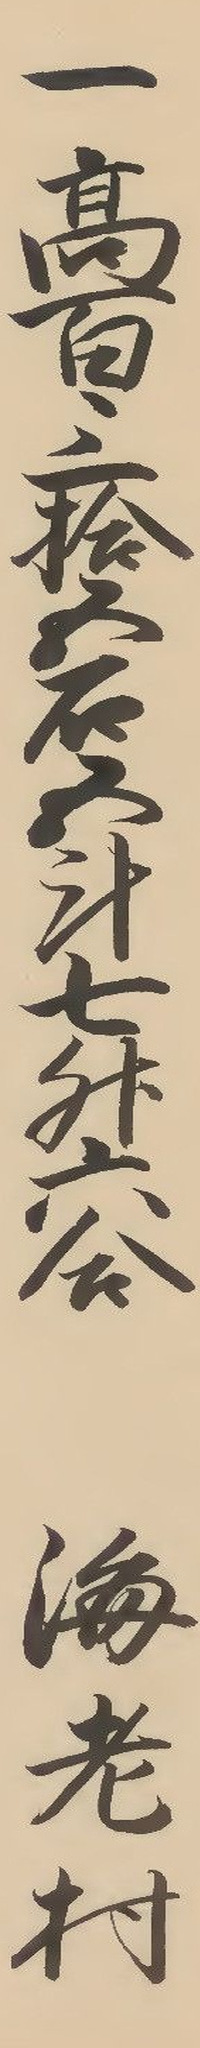一高百三拾五石五斗七升六合海老村
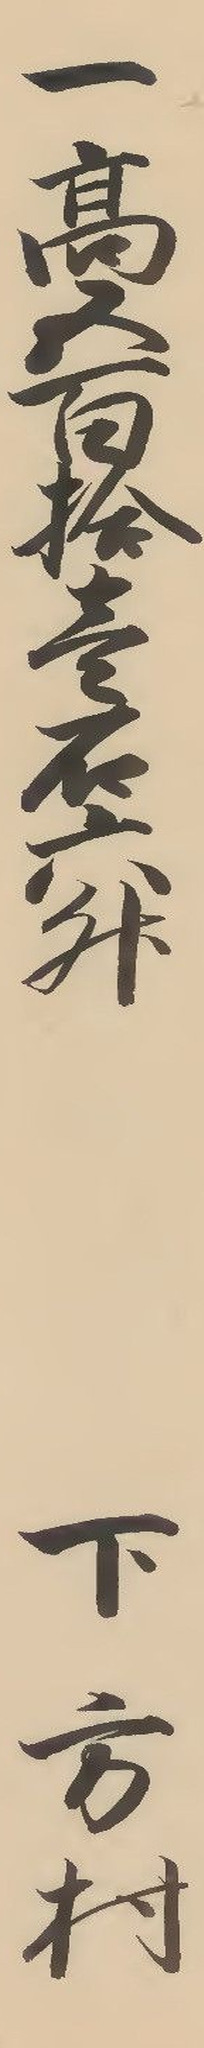一高五百拾壱石六升下方村
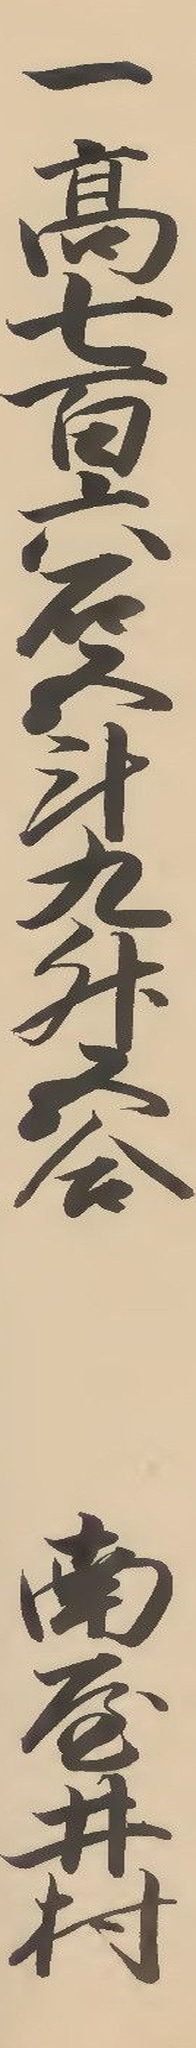一高七百六石五斗九升五合南屋井村
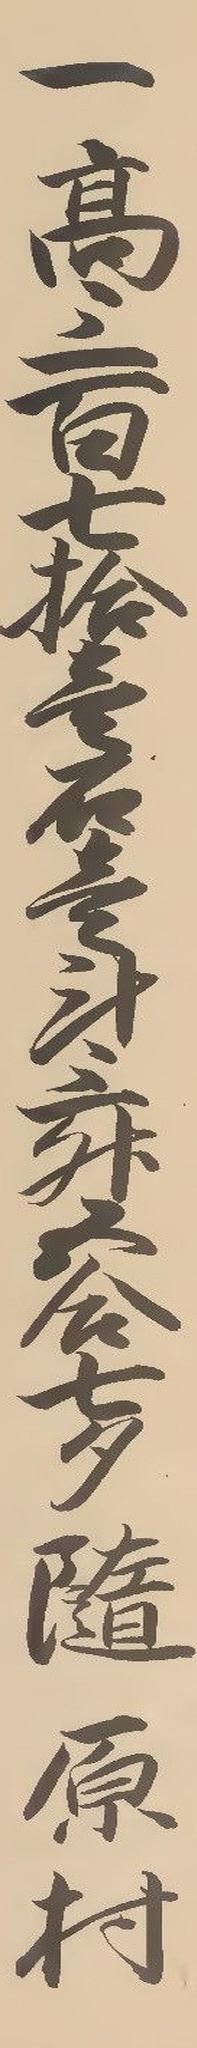一高三百七拾壱石壱斗三升五合七勺随原村
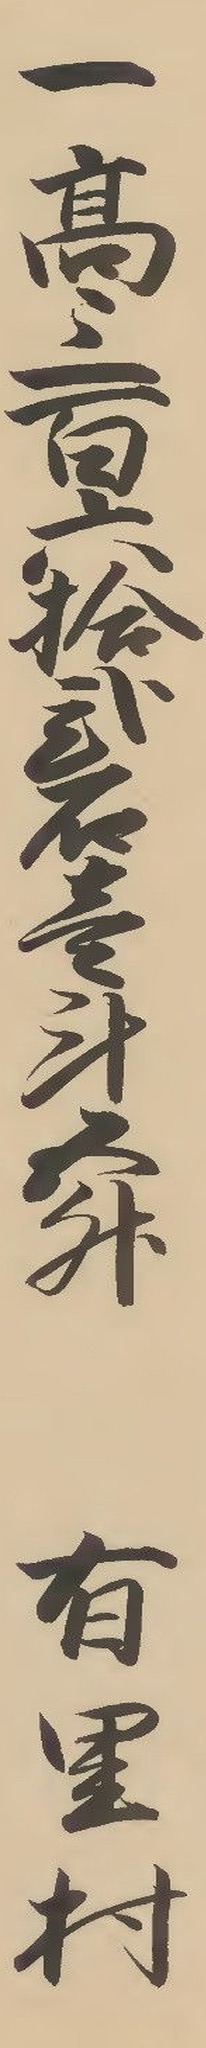一高三百六拾弐石壱斗五升有里村
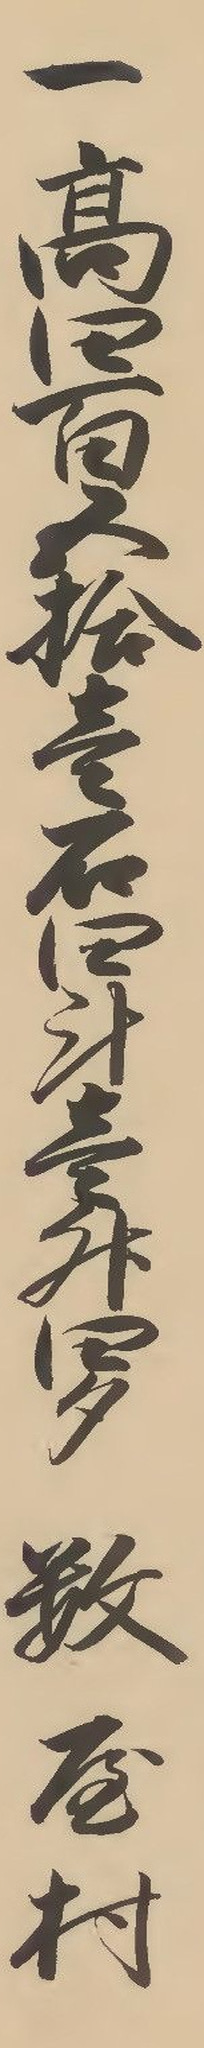一高四百五拾壱石四斗壱升四勺数屋村
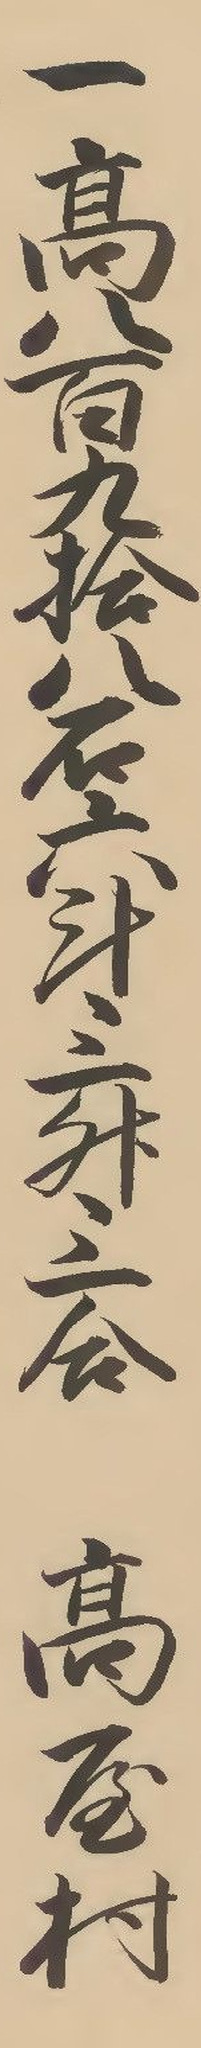一高八百九拾八石六斗三升三合高屋村

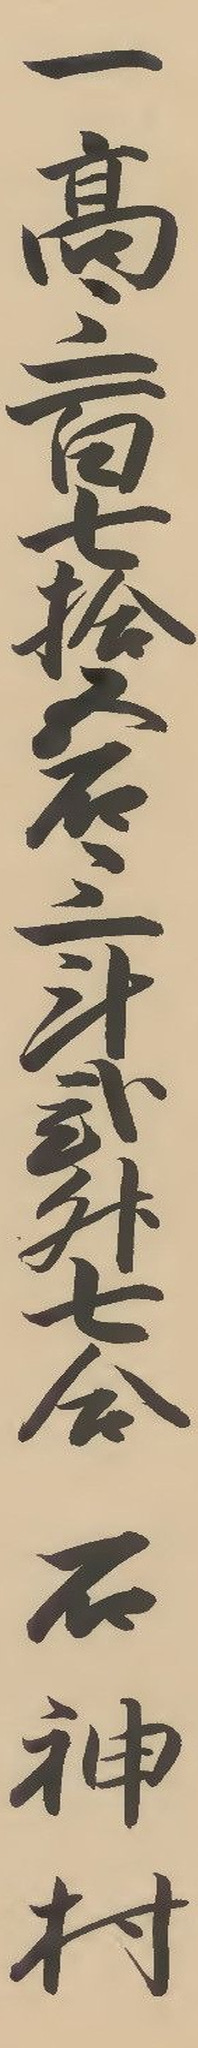一高三百七拾五石三斗弐升七合石神村
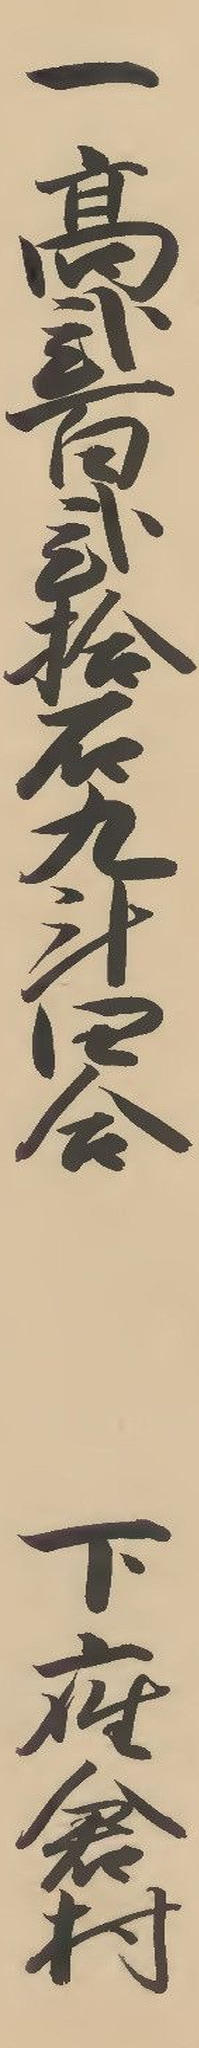一高弐百弐拾石九斗四合下座倉村
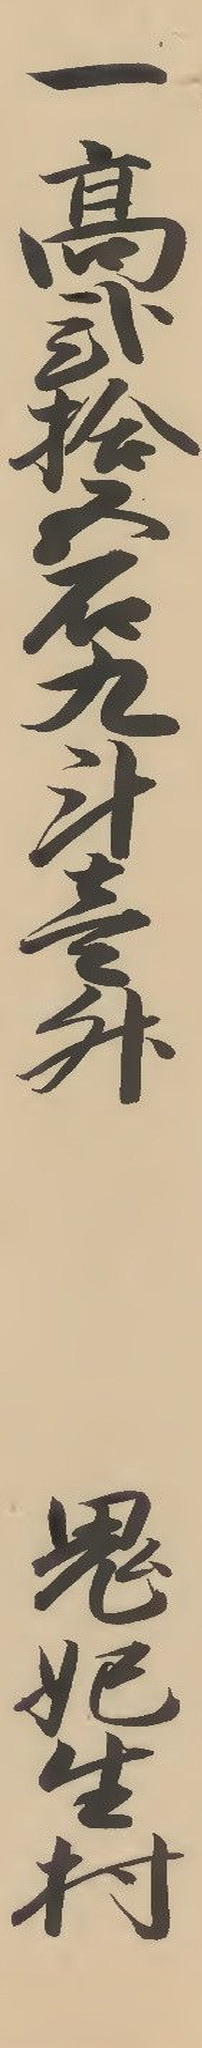一高弐拾五石九斗壱升鬼妃生村
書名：美濃国郷帳
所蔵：国立公文書館 National Archives of Japan
